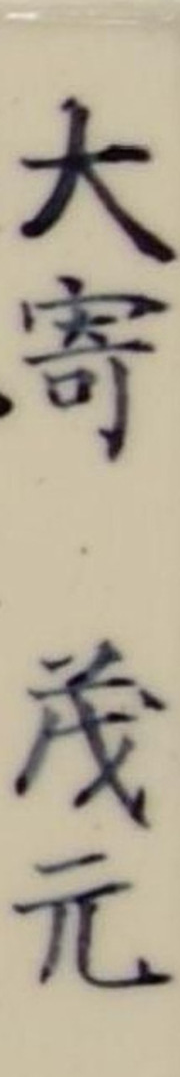大寄茂元
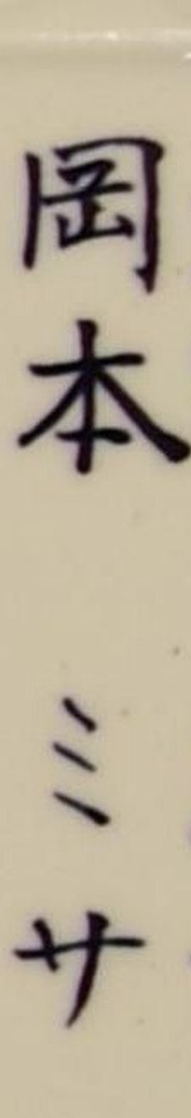岡本ミサ
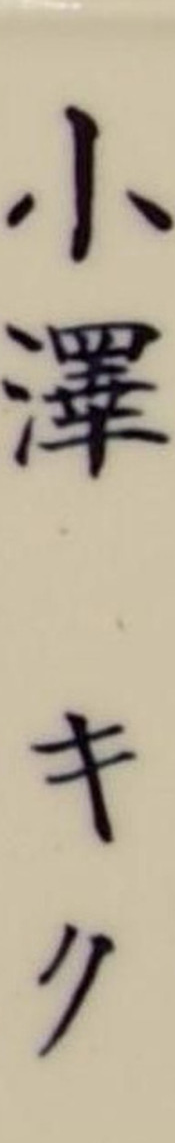小澤キク
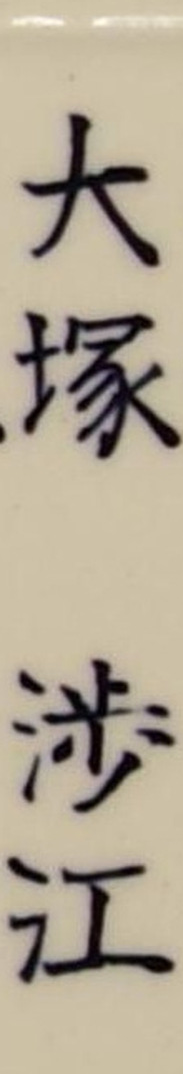大塚渉江
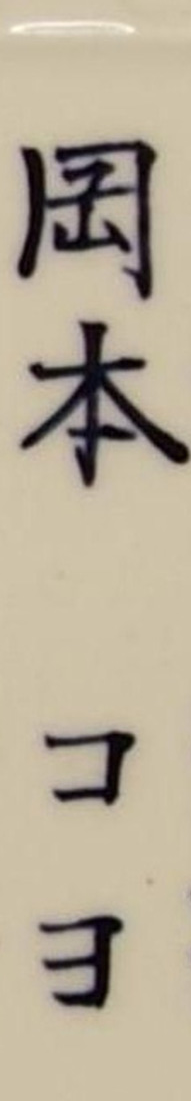岡本コヨ
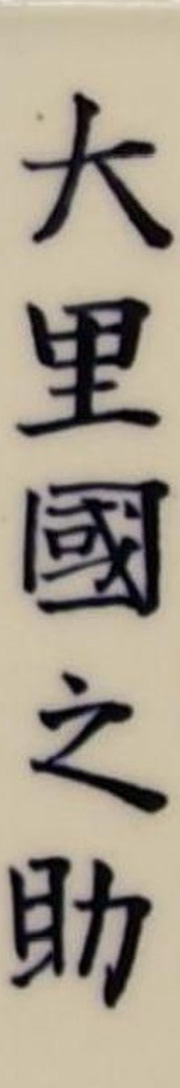大里國之助
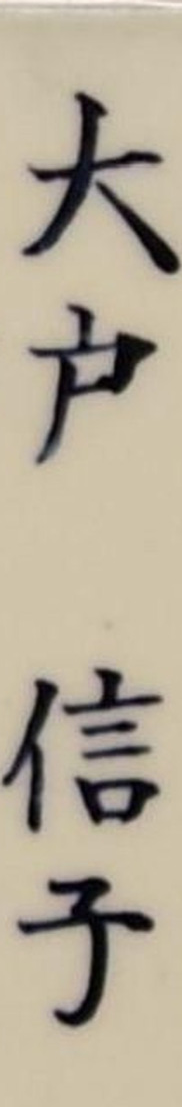大戸信子
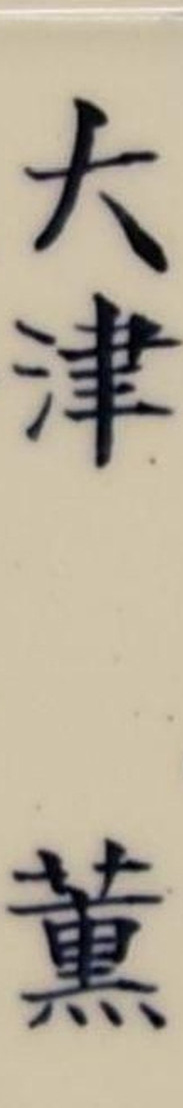大津薫
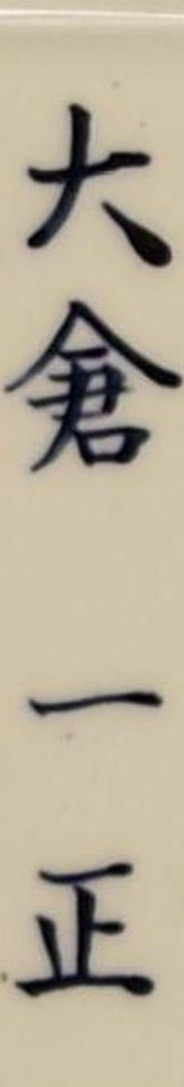大倉一正
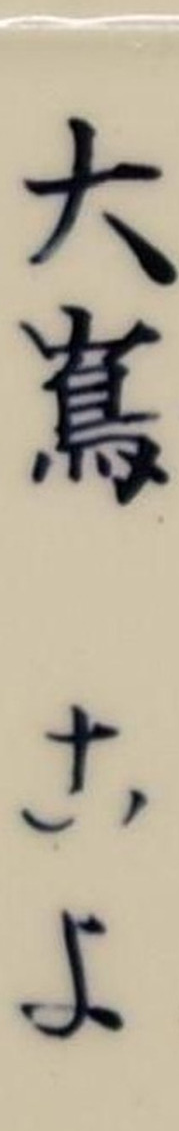大嶌こよ
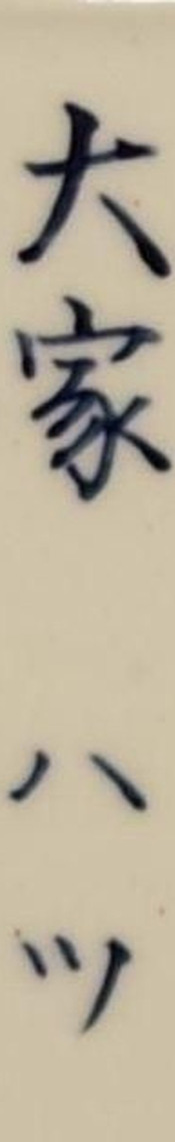大家ハツ
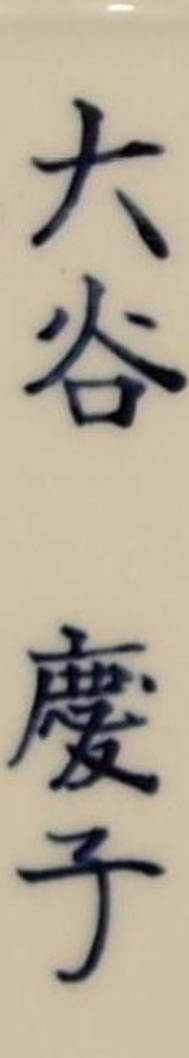大谷慶子
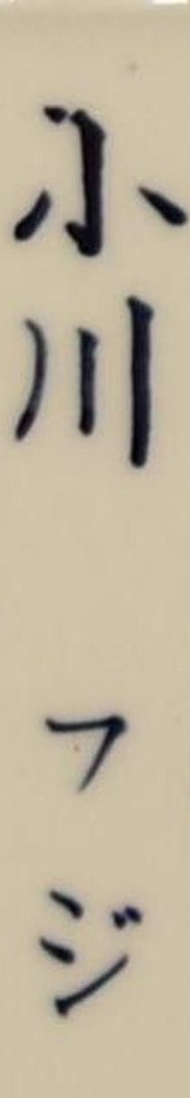小川フジ
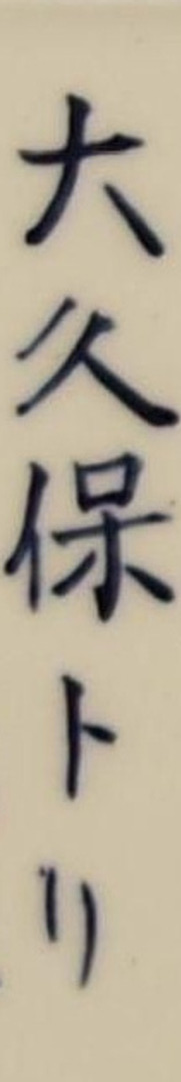大久保トリ
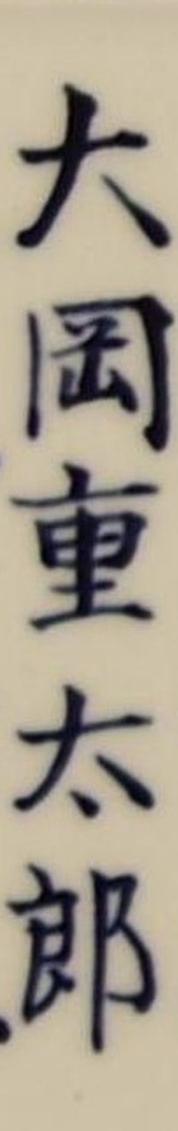大岡重太郎
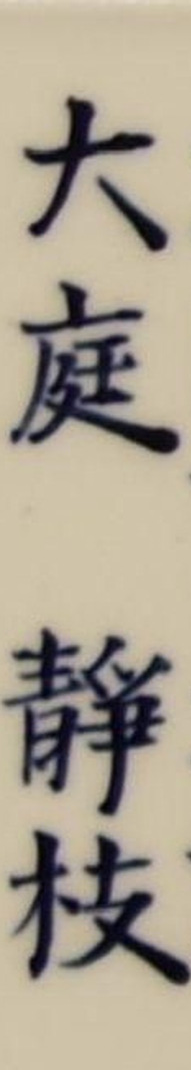大庭静枝
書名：A~D
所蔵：koyasan kongobuji
